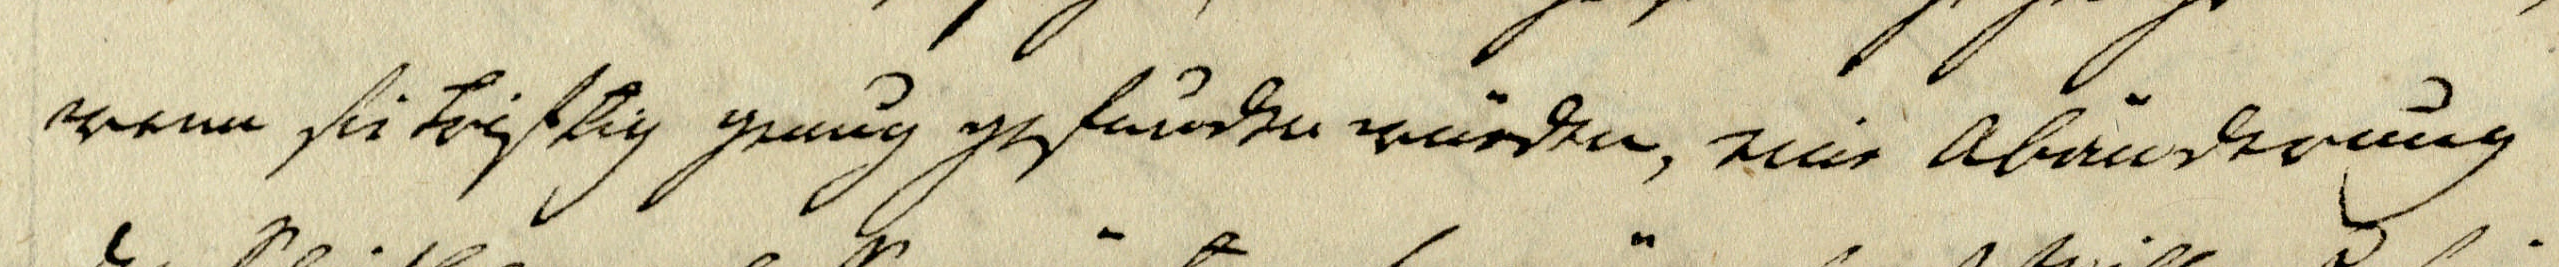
wenn sie triftig genug gefunden würden, eine Abänderung
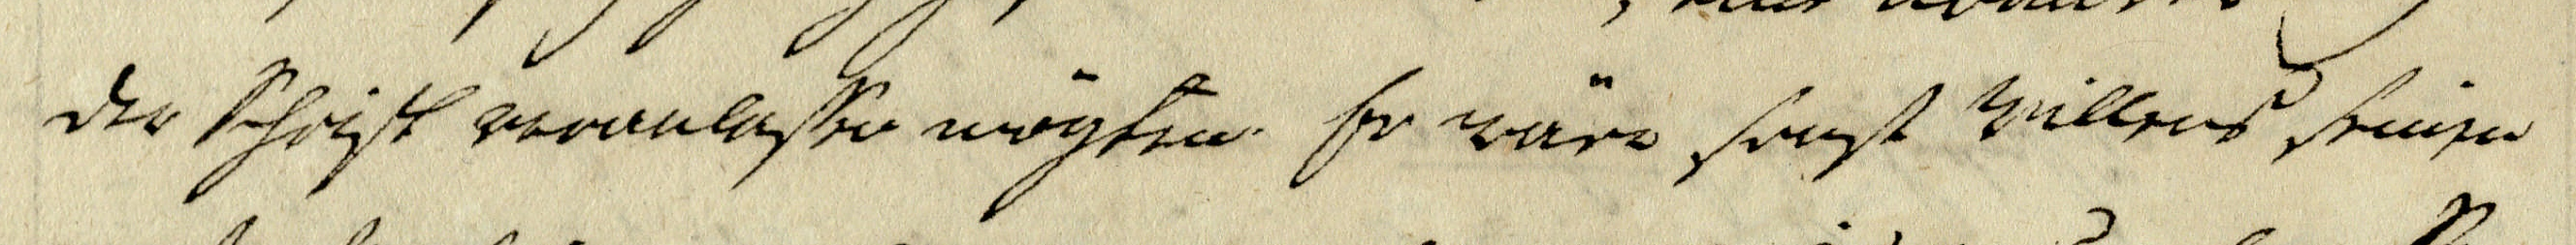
der Schrift veranlassen mögten. Er wäre sonst Willens seinen
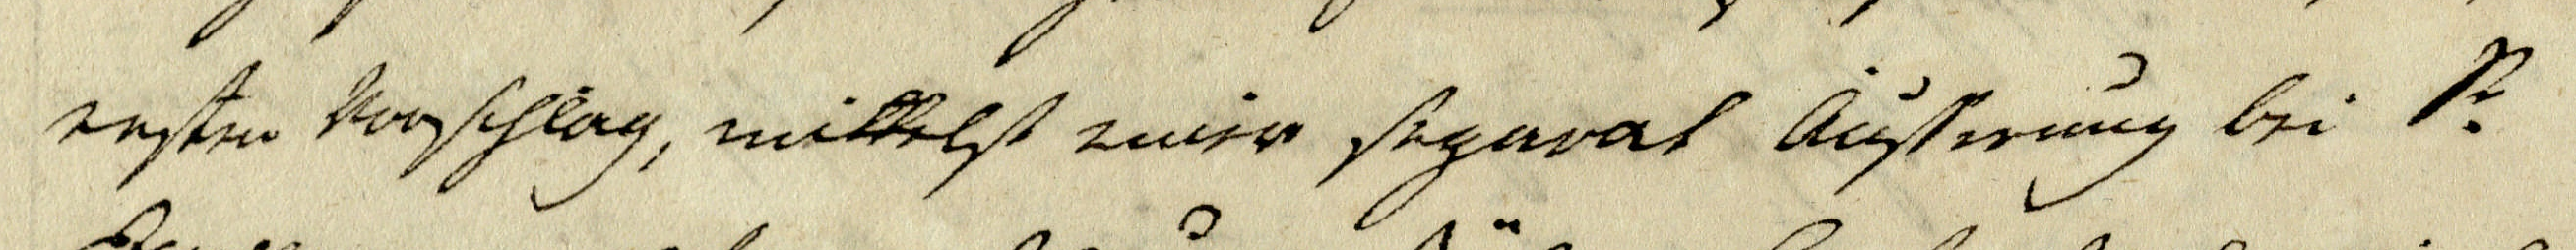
ersten Vorschlag, mittelst einer separat Äusserung bei Sr
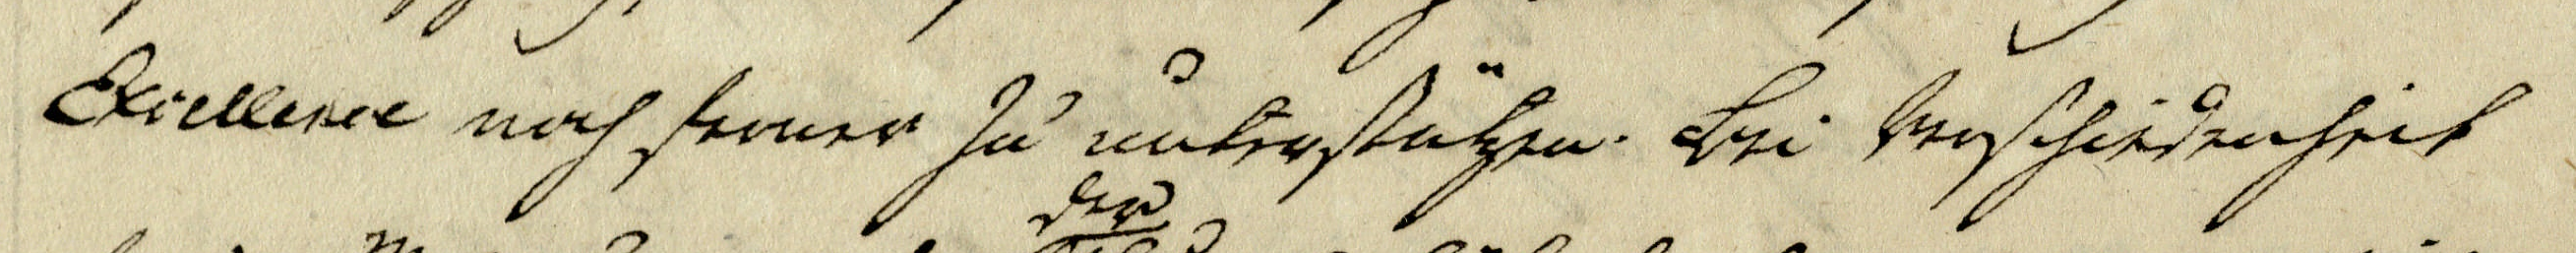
Excellence noch ferner zu unterstützen. Bei Verschiedenheit
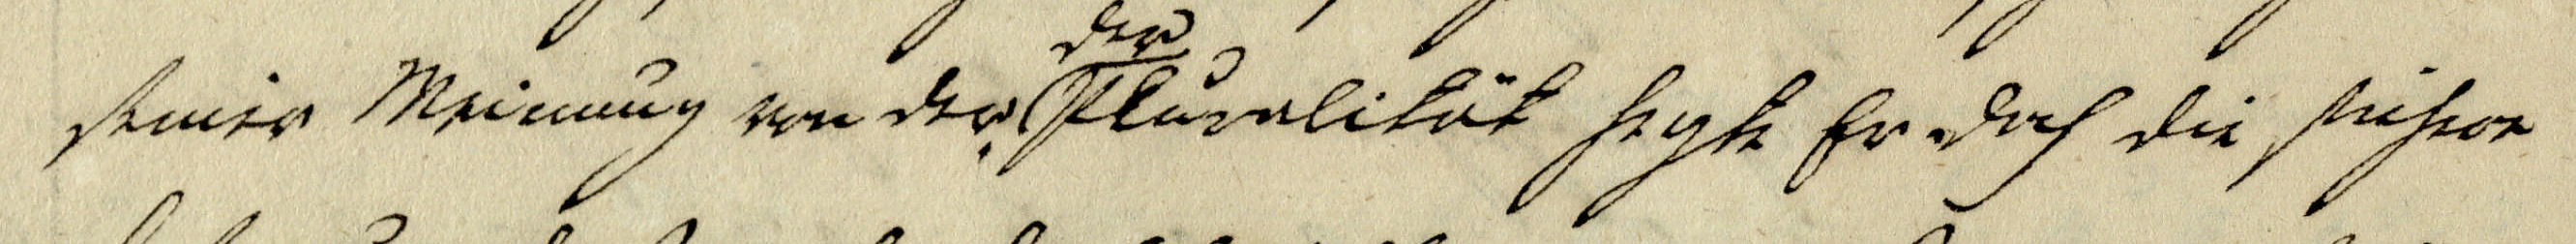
seiner Meinung von der Pluralität hegte Er doch die sichere
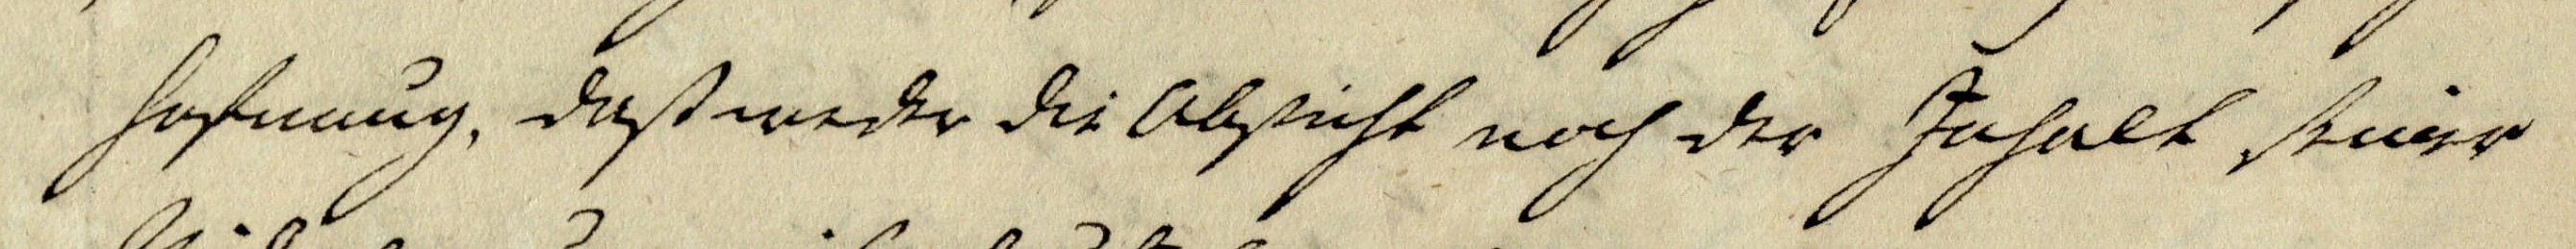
Hofnung, daß weder die Absicht noch der Inhalt seiner
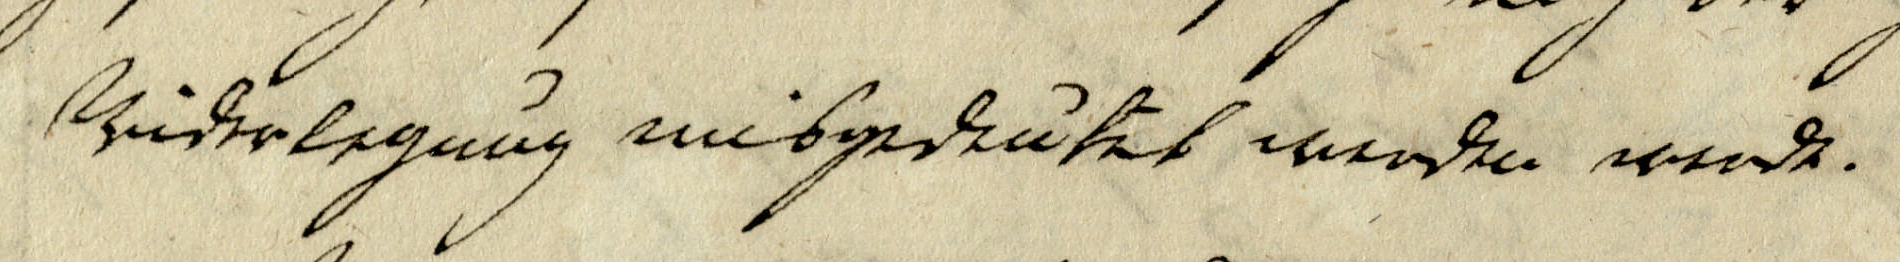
Widerlegung misgedeutet werden werde.
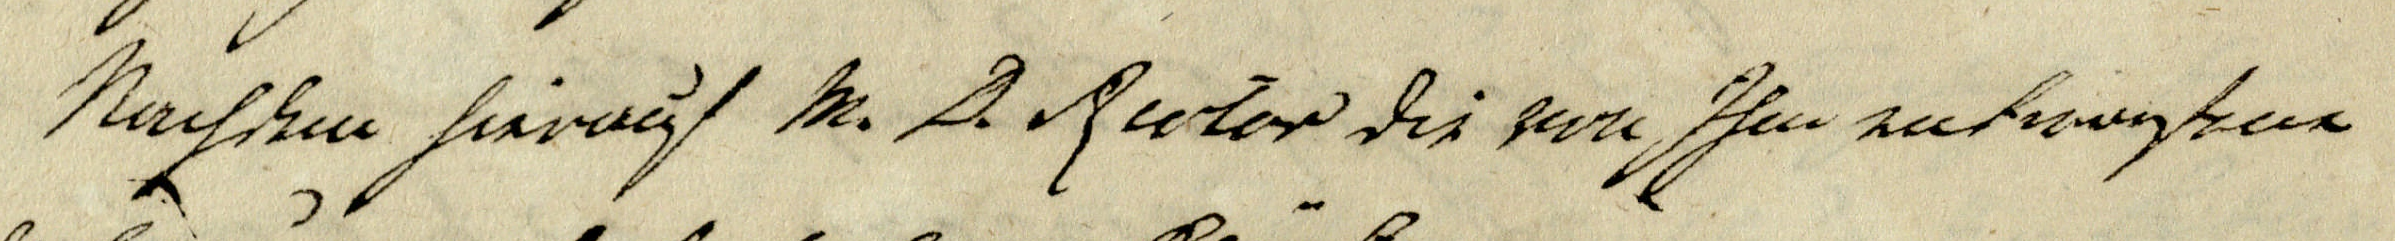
Nachdem hierauf M. D. Rector die von Ihm entworfene
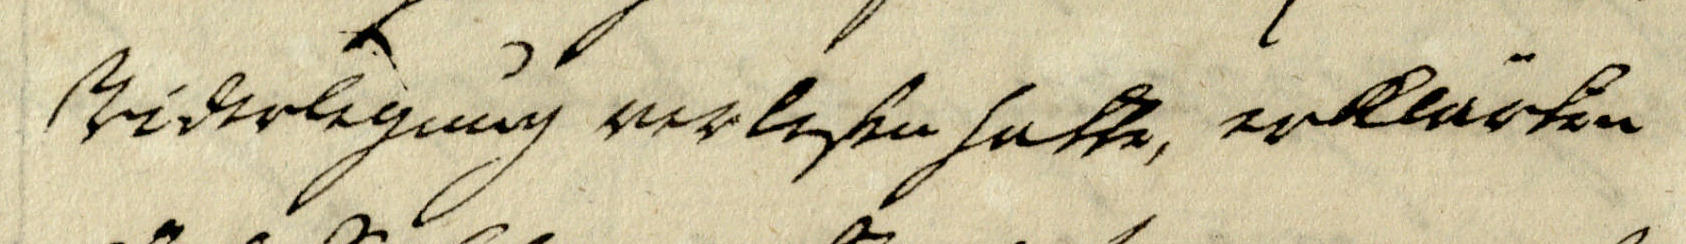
Widerlegung verlesen hatte, erklärten
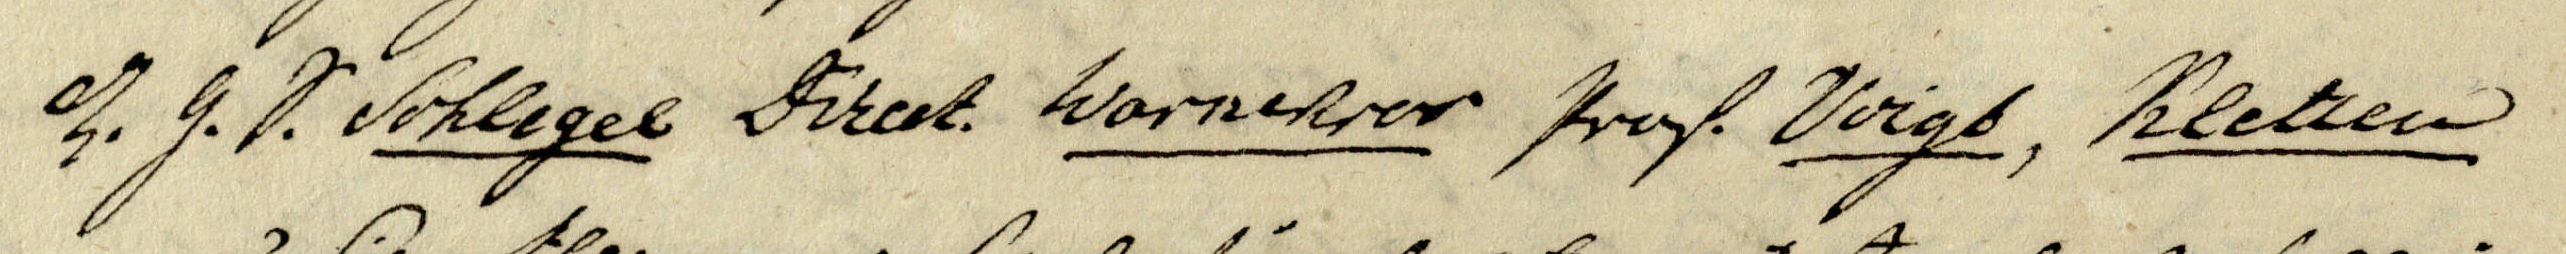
dh. G. S. Schlegel Direct. Warnekros Prof. Voigt, Kletten
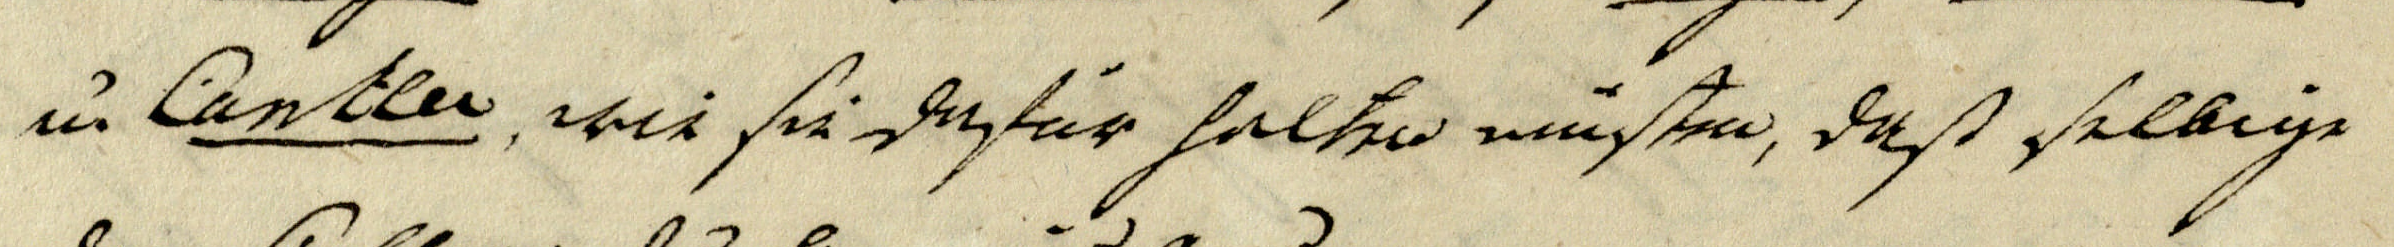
u. Canzler, wie sie dafür halten müsten, daß selbige
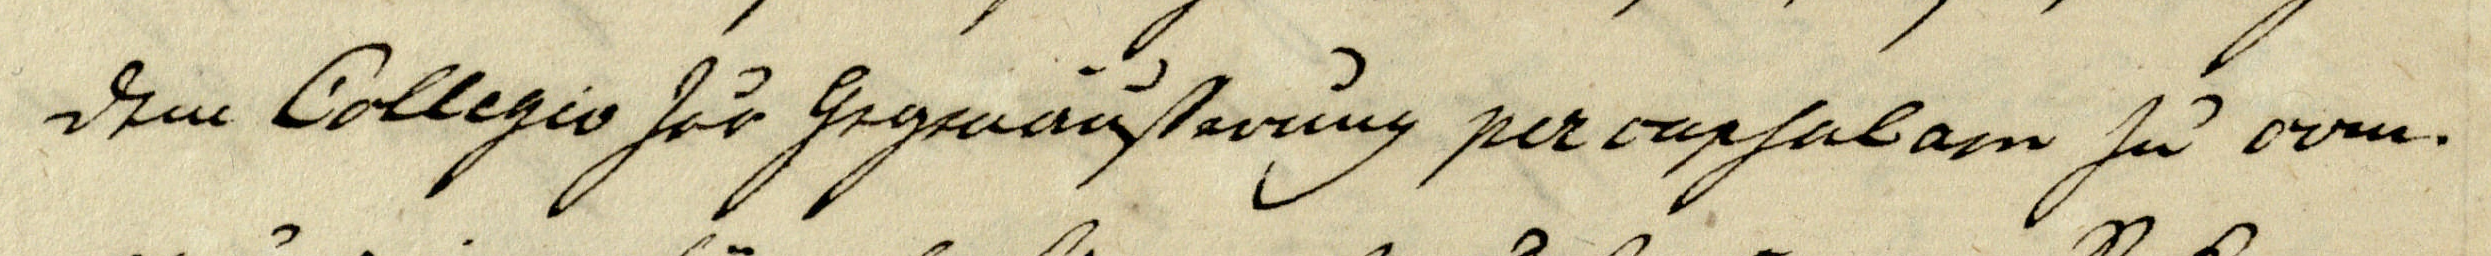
dem Collegio zur Gegenäusserung per capsulam zu com¬
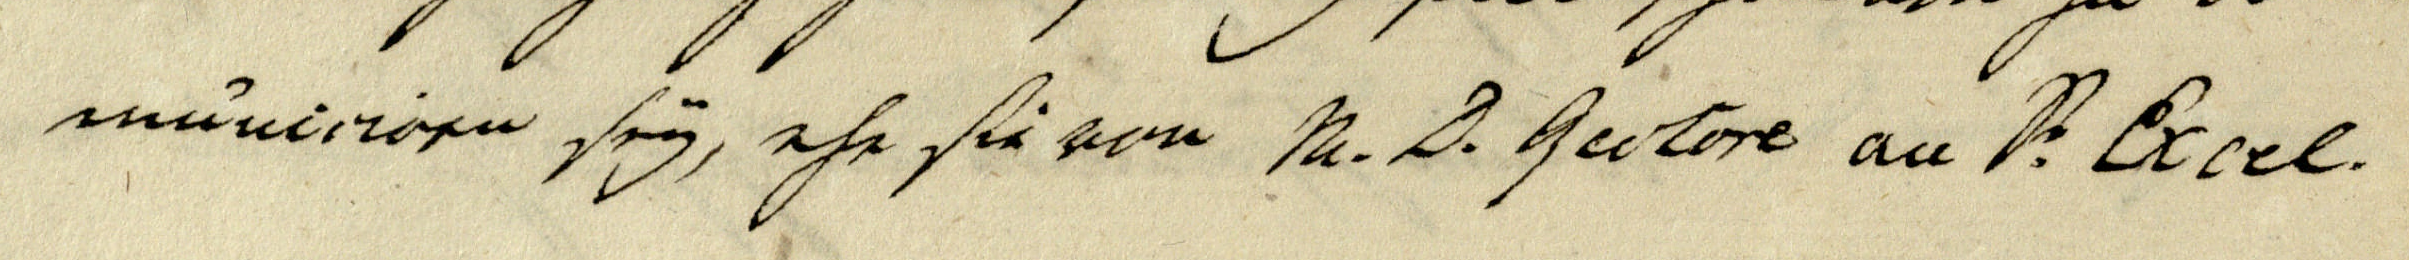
municiren seÿ, ehe sie von M. D. Rectore an Sr. Excel¬
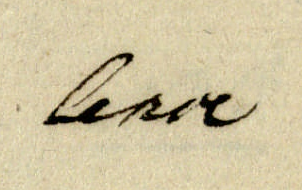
lence
